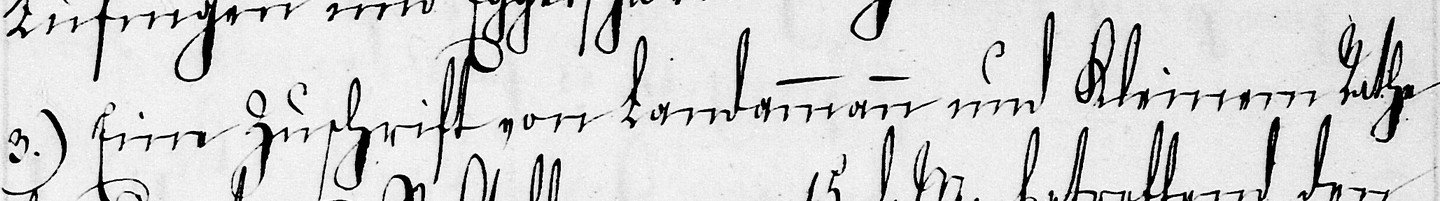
3.) Eine Zuschrift von Landammann und Kleinem Rathe
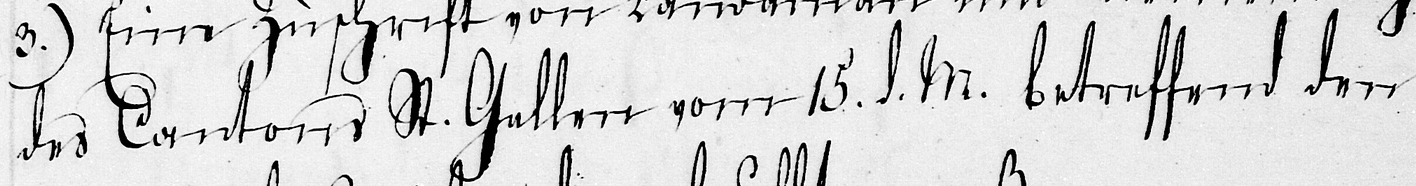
des Cantons St. Gallen vom 15. d. M. betreffend den
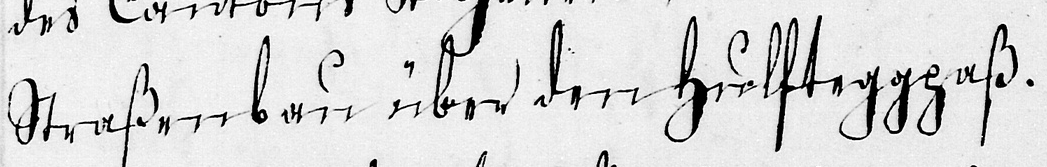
Straßenbau über den Hulfteggpaß.
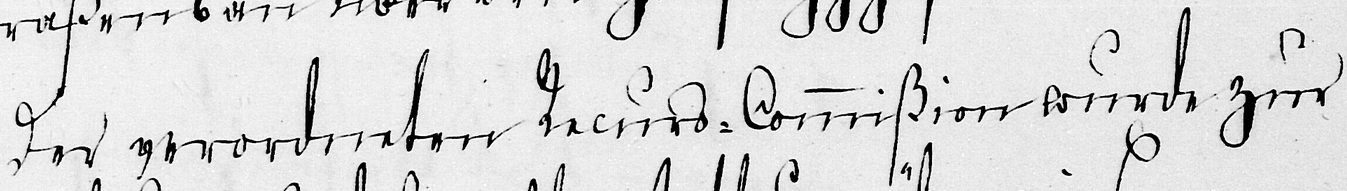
Der verordneten Recurs-Commißion wurde zur
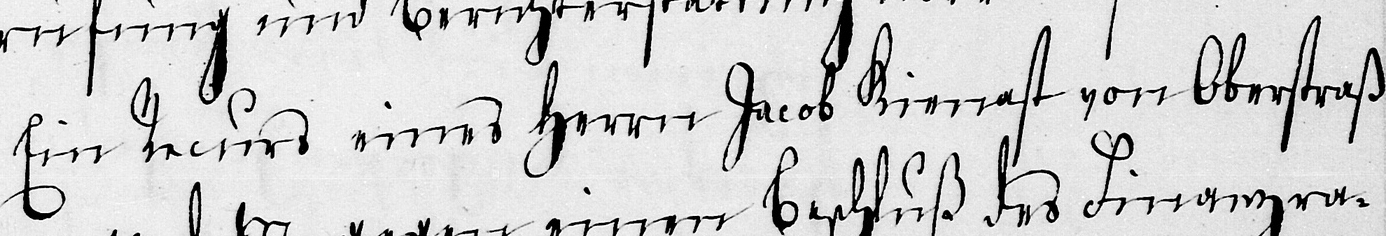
Ein Recurs eines Herrn Jacob Kienast von Oberstraß
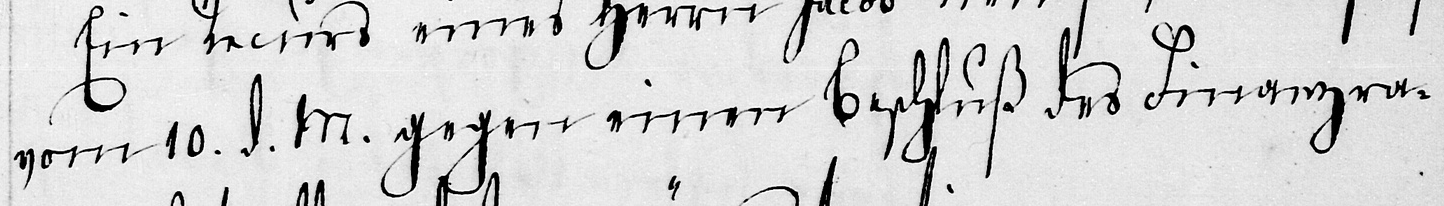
vom 10. d. M. gegen einen Beschluß des Finanzra¬
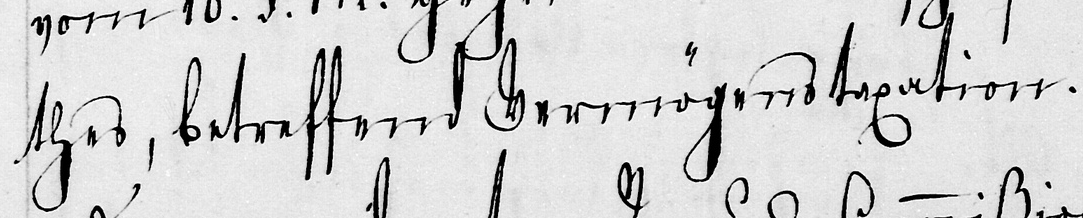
thes, betreffend Vermögenstaxation.
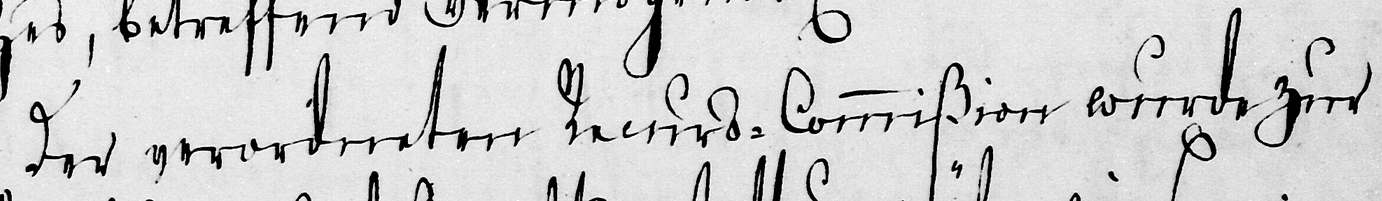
Der verordneten Recurs-Commißion wurde zur
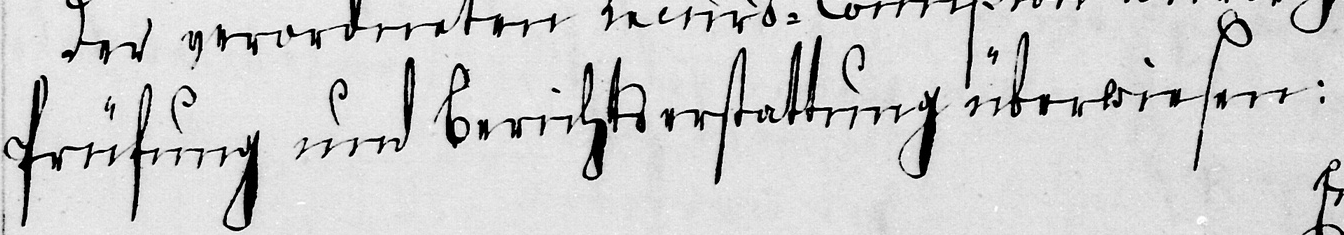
Prüfung und Berichtserstattung überwiesen:
